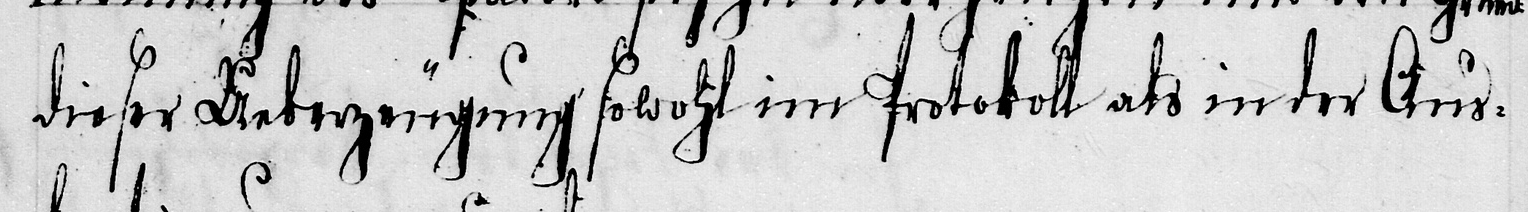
dieser Ueberzeugung sowohl im Protokoll als in der Aus¬
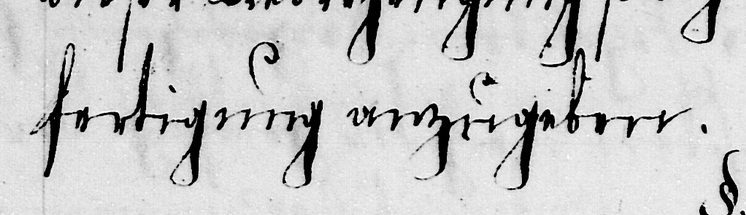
fertigung anzugeben.
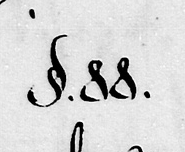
§. 88.
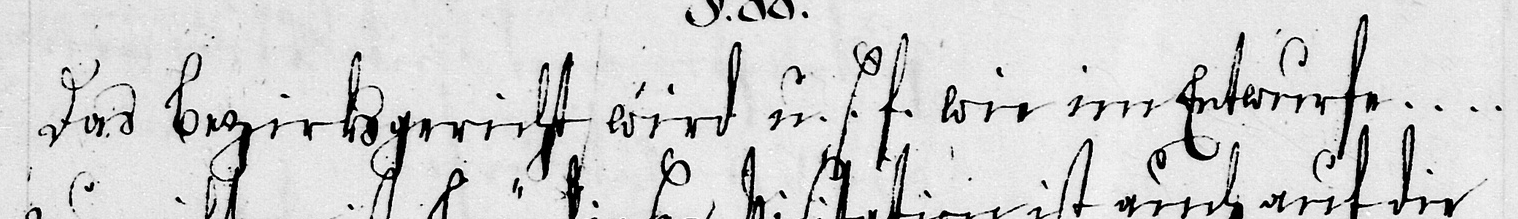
Das Bezirksgericht wird u. s. f. wie im Entwurfe …
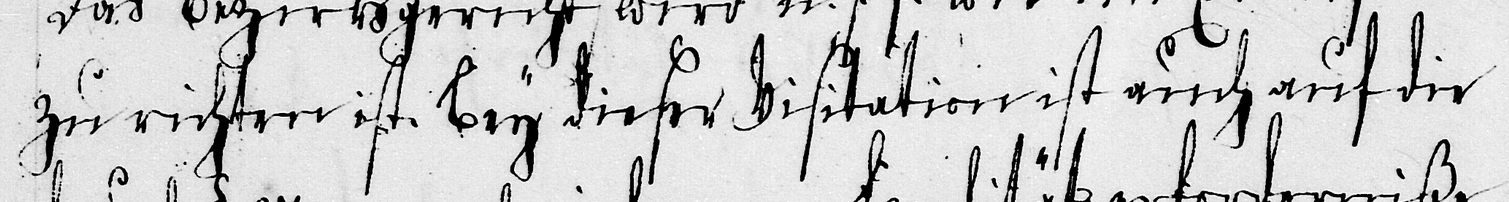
zu richten ist. Bey dieser Visitation ist auch auf die
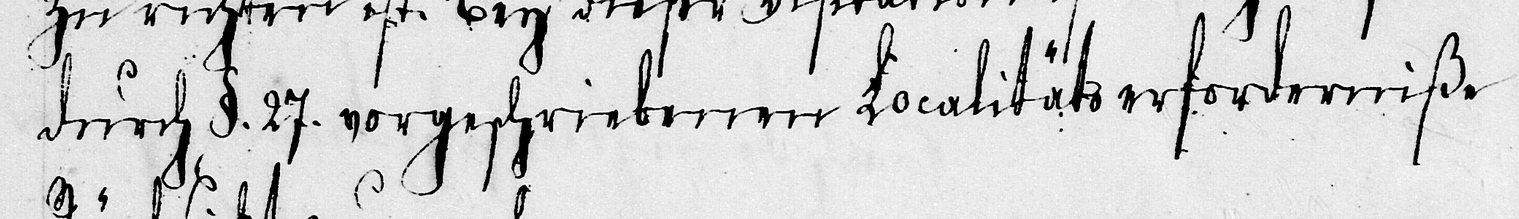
durch §. 27. vorgeschriebenen Localitätserforderniße
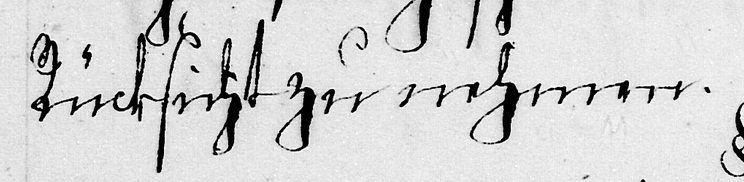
Rücksicht zu nehmen.
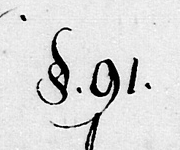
§. 91.
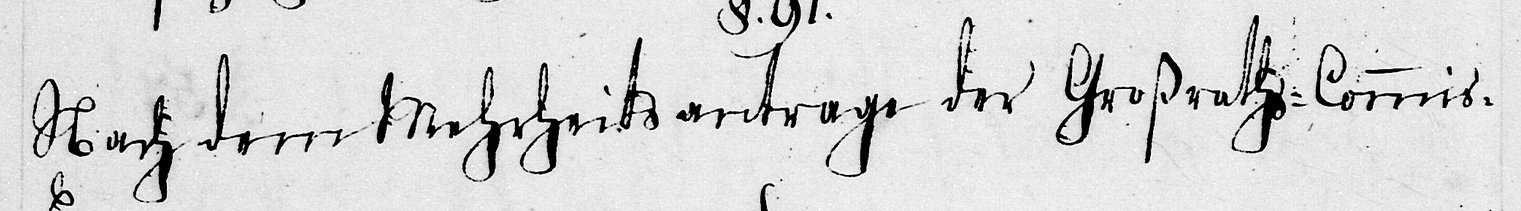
Nach dem Mehrheitsantrage der Großraths-Commiß¬
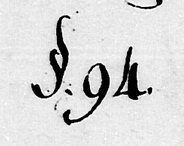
§. 94.
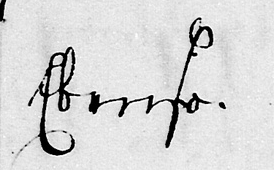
Ebenso.
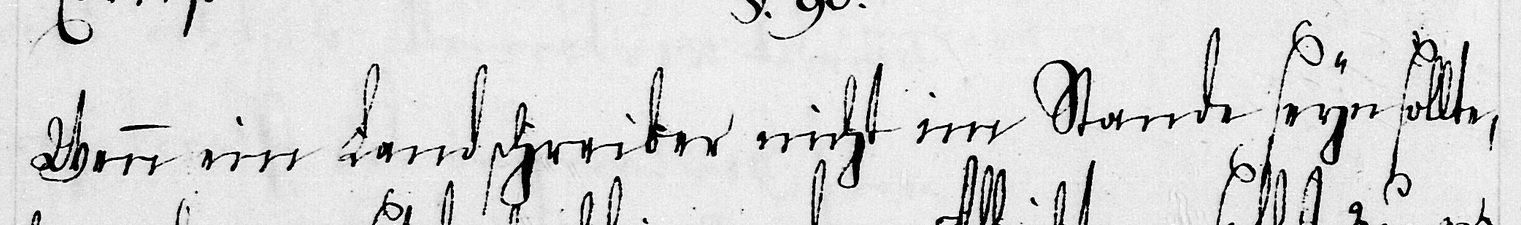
Wenn ein Landschreiber nicht im Stande seyn soll¬
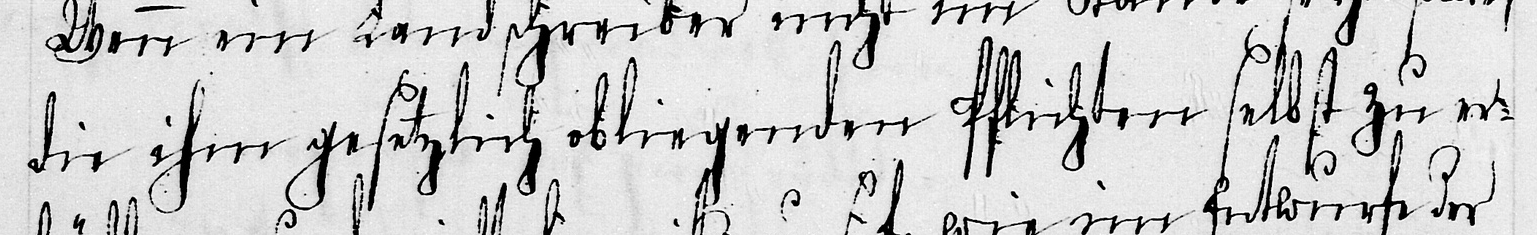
die ihm gesetzlich obliegenden Pflichten selbst zu er¬
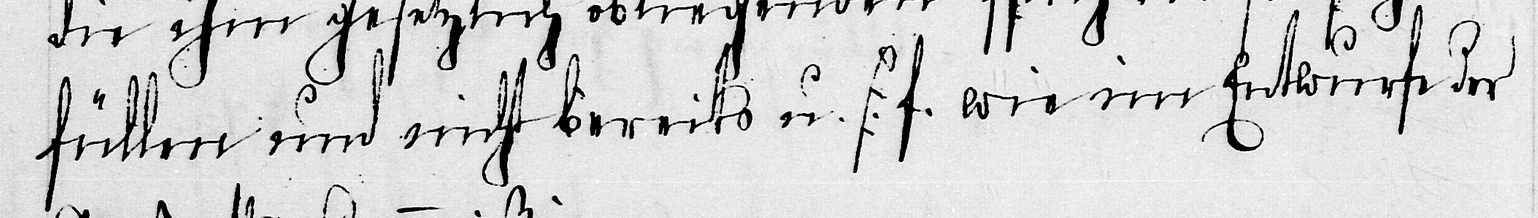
füllen und nicht bereits u. s. f. wie im Entwurfe der
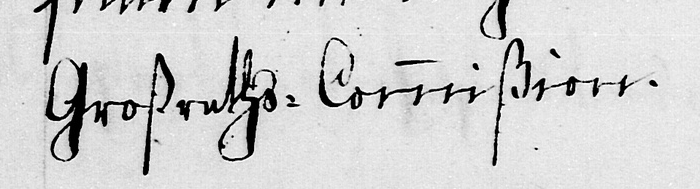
Großraths-Commißon.
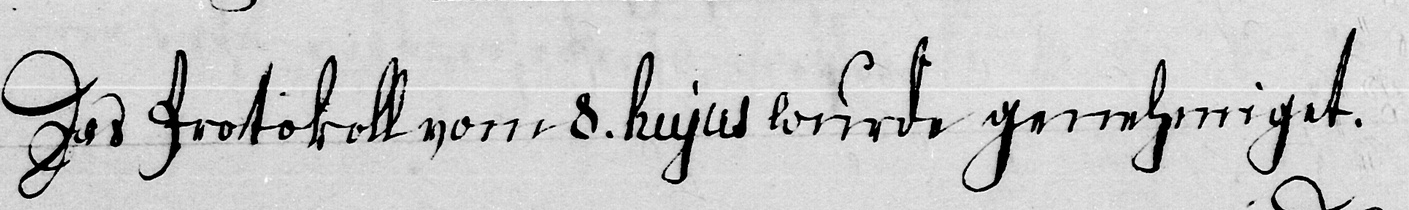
Das Protokoll vom 8. hujus wurde genehmiget.
